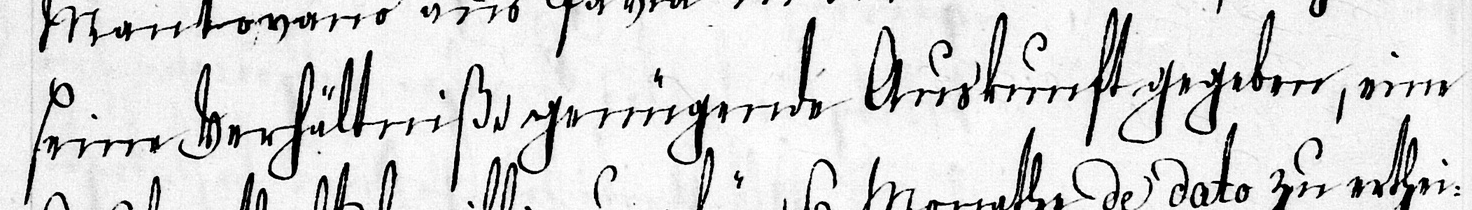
seine Verhältniße genügende Auskunft gegeben, eine
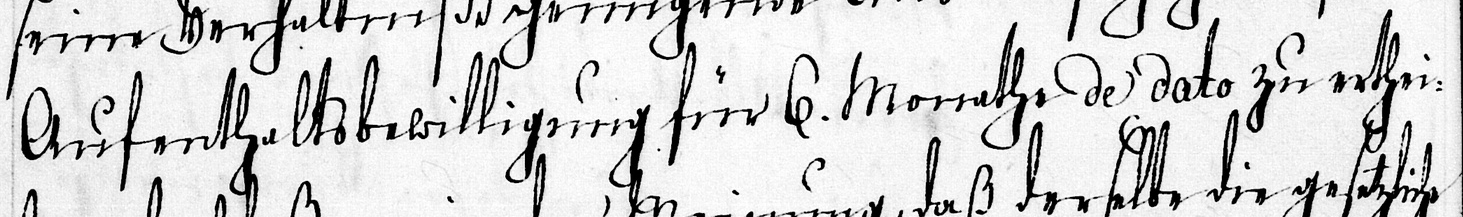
Aufenthaltsbewilligung für 6. Monathe de dato zu erthei¬
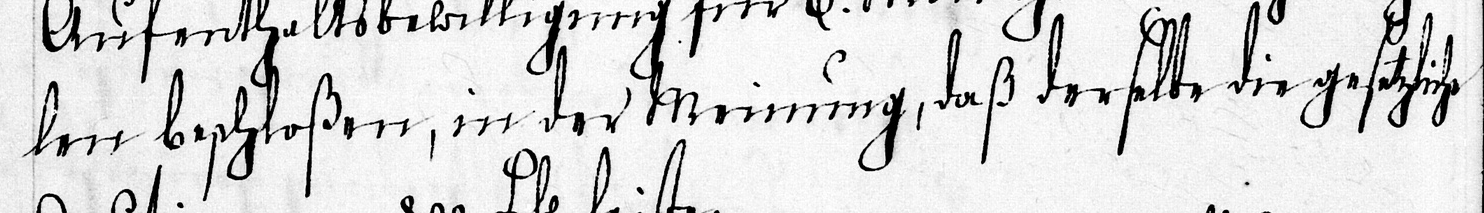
len beschloßen, in der Meinung, daß derselbe die gesetzlic¬
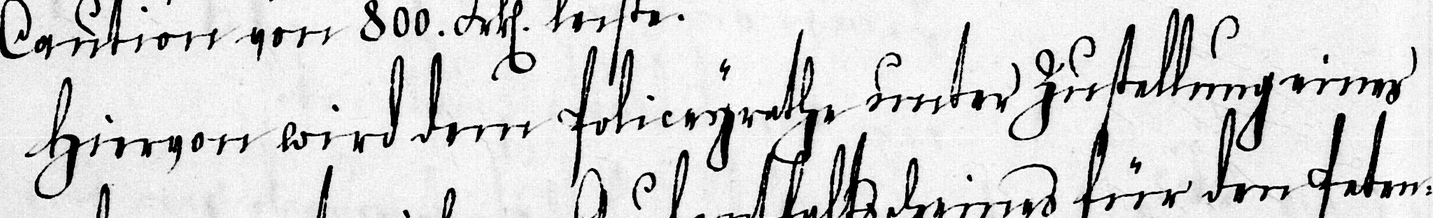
Hiervon wird dem Policeyrathe unter Zustellung eines
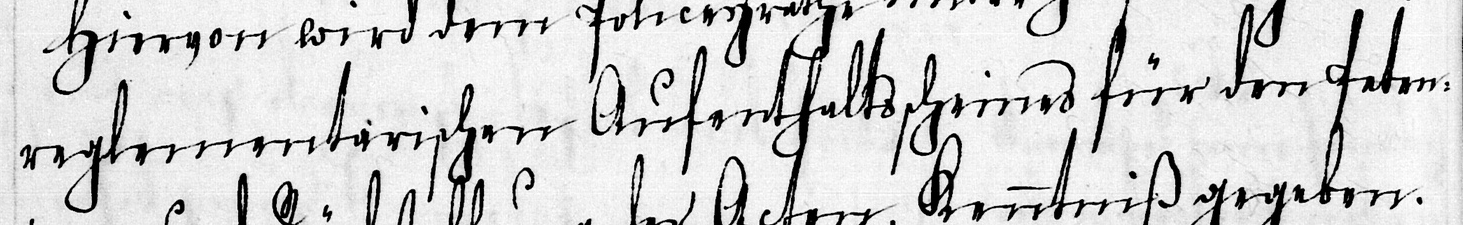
reglementarischen Aufenthaltsscheines für den Peten¬
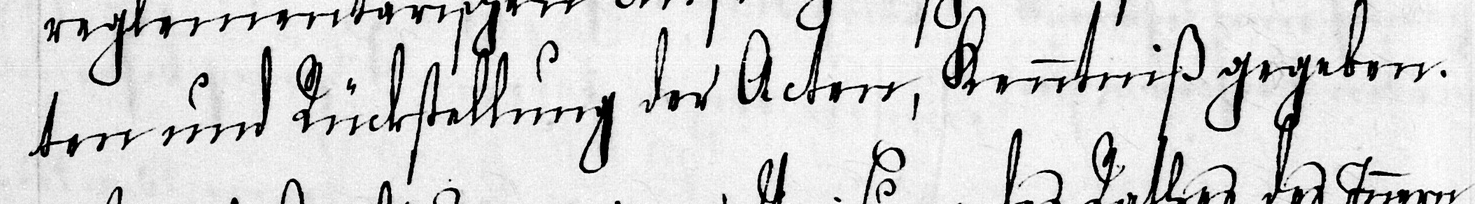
ten und Rückstellung der Acten, Kenntniß gegeben.
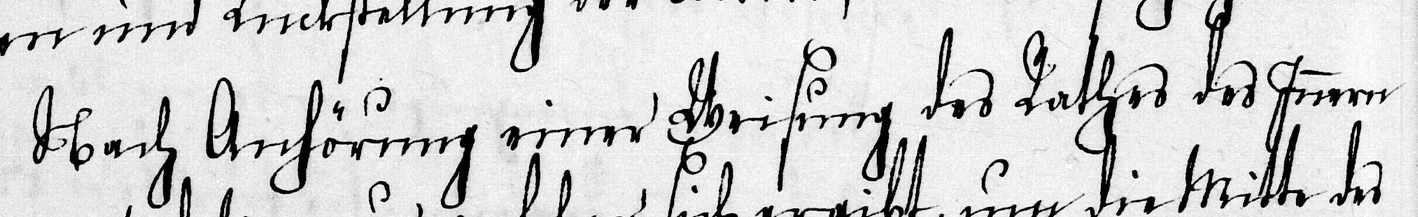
Nach Anhörung einer Weisung des Rathes des Innern
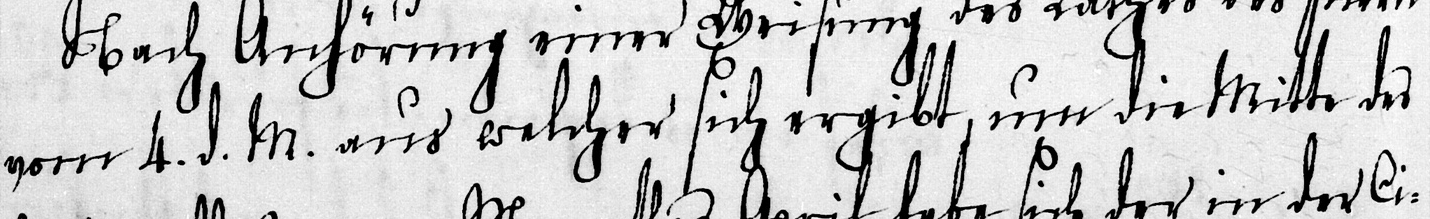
vom 4. d. M. aus welcher sich ergibt, um die Mitte des
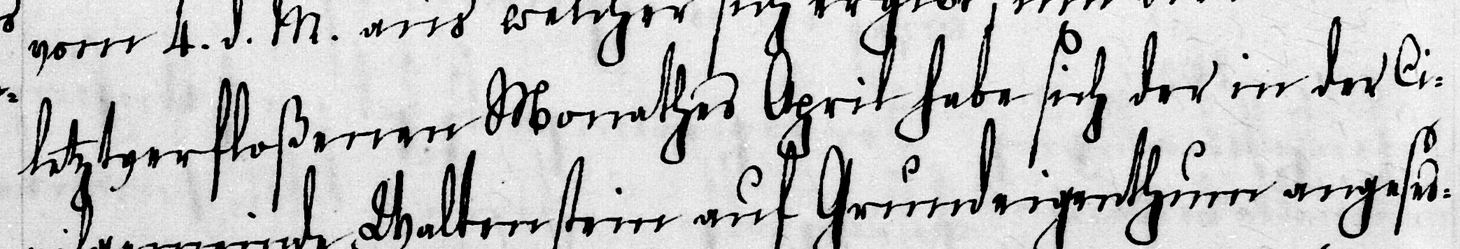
letztverfloßenen Monathes April habe sich der in der Ci¬
